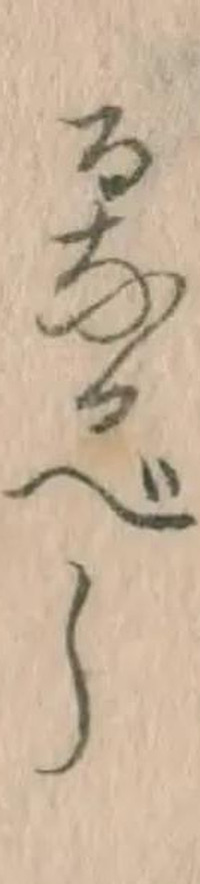るなるべし
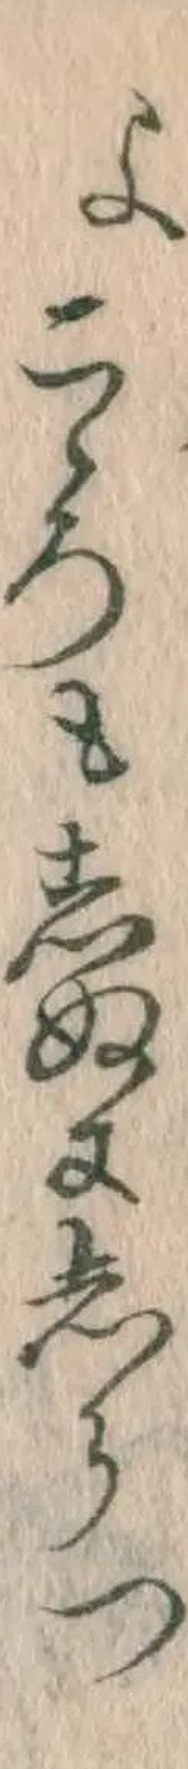よこゝろもしぬにしらつ
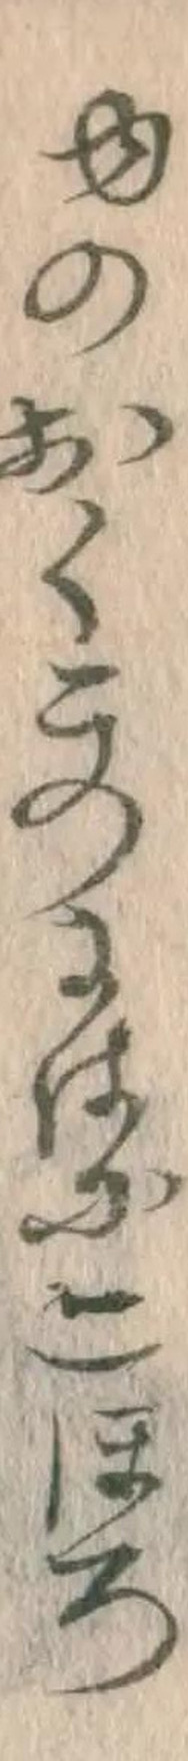ゆのおくこのにはにこほろ
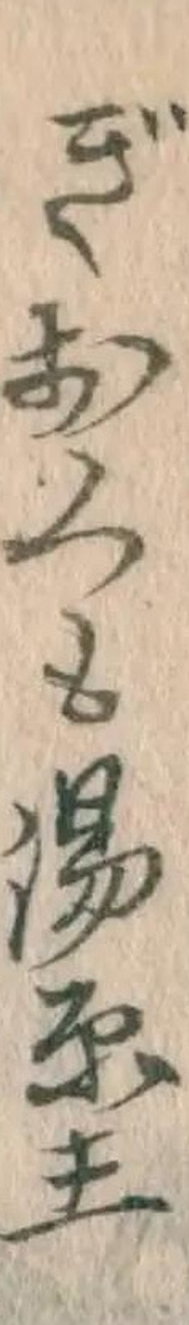ぎなくも湯原王
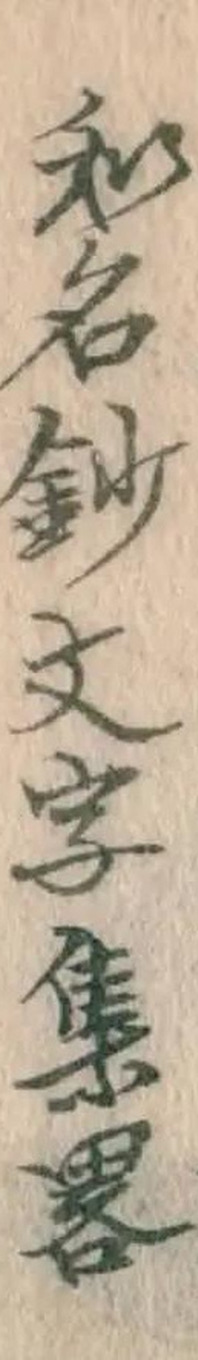和名鈔文字集略
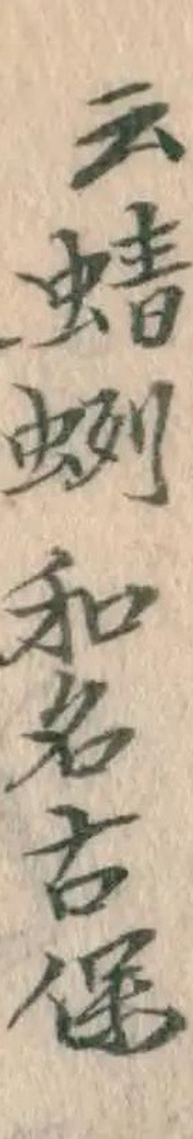云蜻蛚和名古保
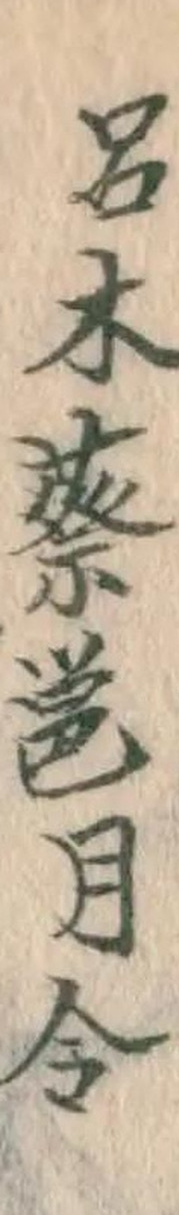呂木蔡邕月令
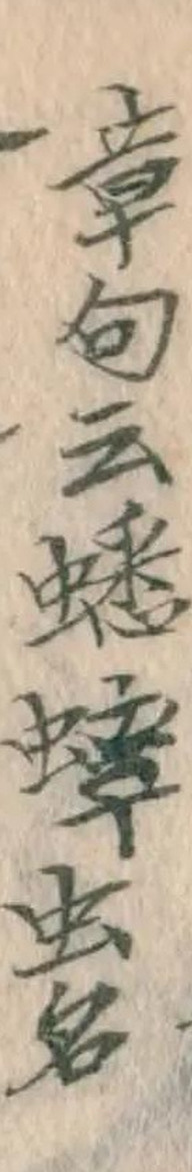章句云蟋蟀虫名
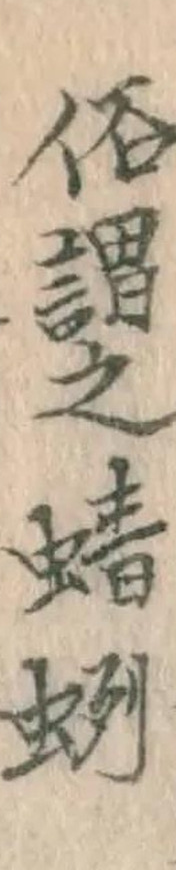俗謂之蜻蛚
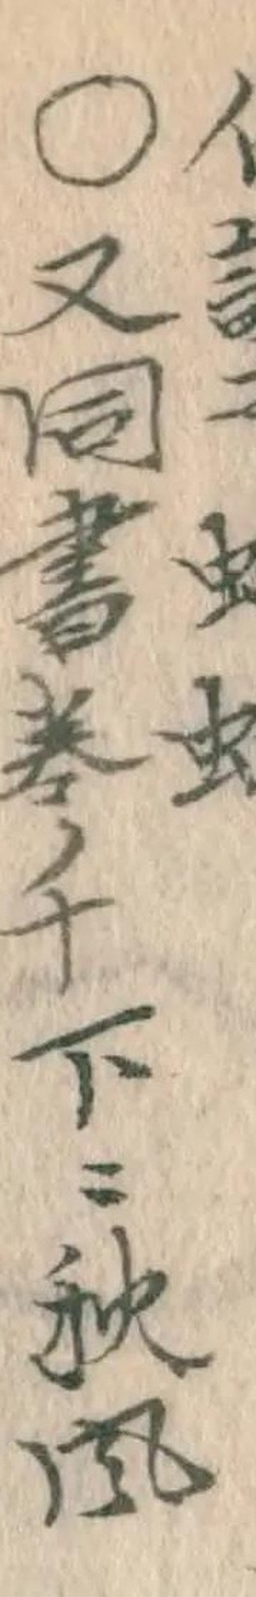○又同書巻ノ十下ニ秋風
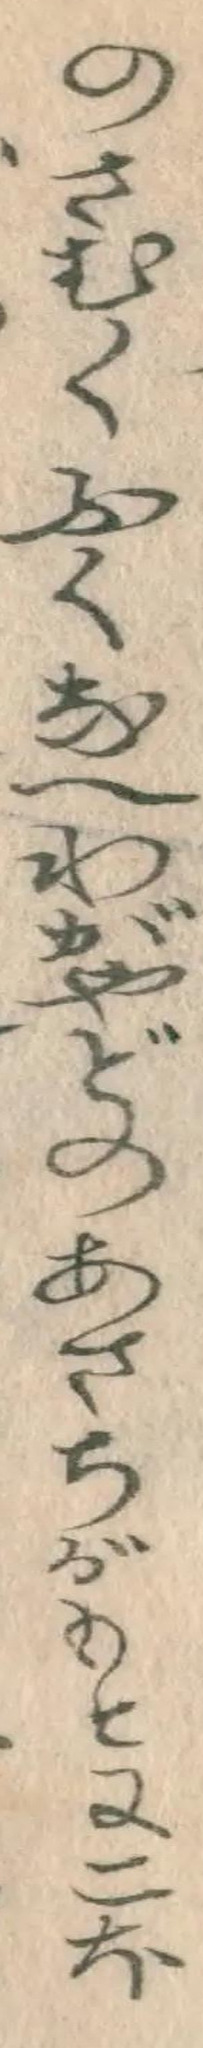のさむ〱ふくなへわがやどのあさちがもとにこほ
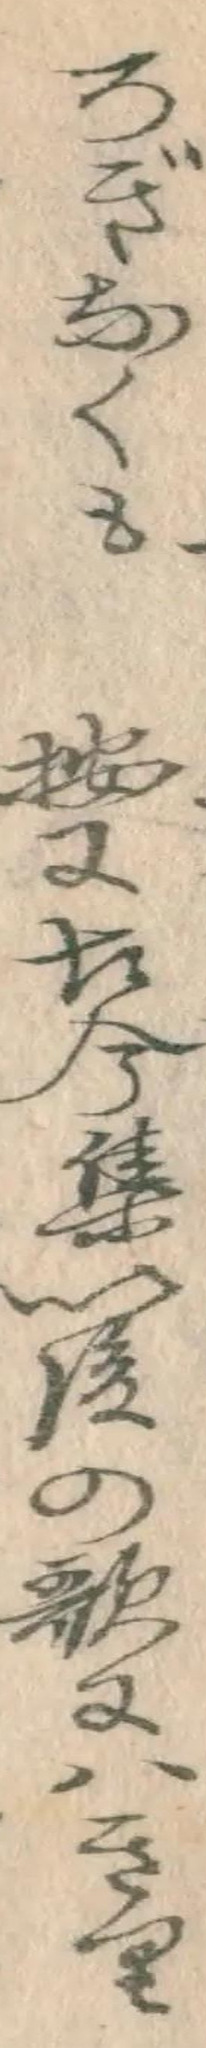ろぎなくも按に古今集以後の歌にはきり
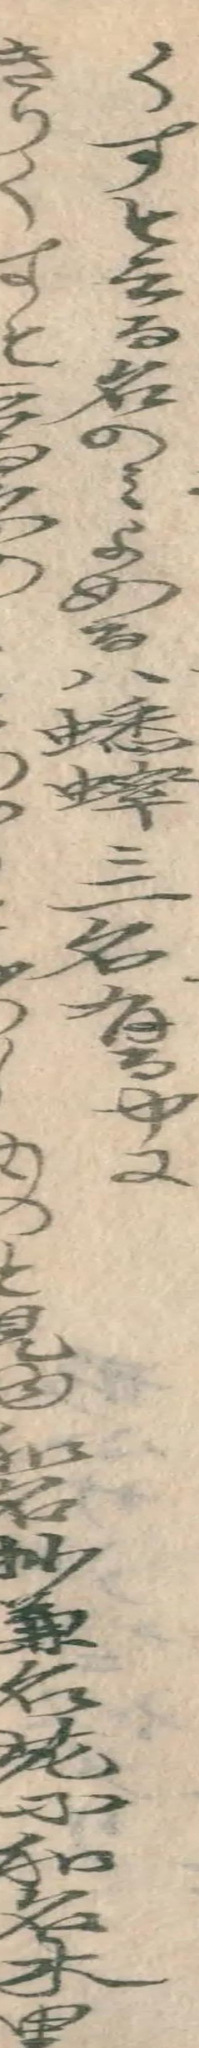〱すと云る名のみよめるは蟋蟀ニ二名有る中に
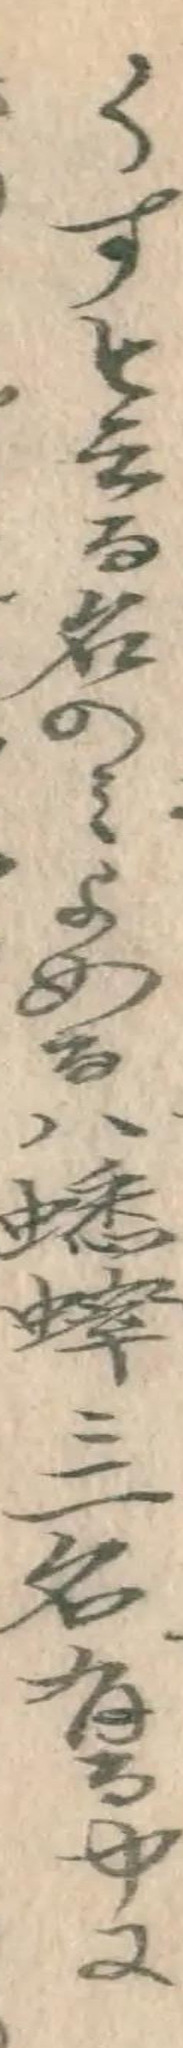〱すと云る名のみよめるは蟋蟀ニ二名有る中に
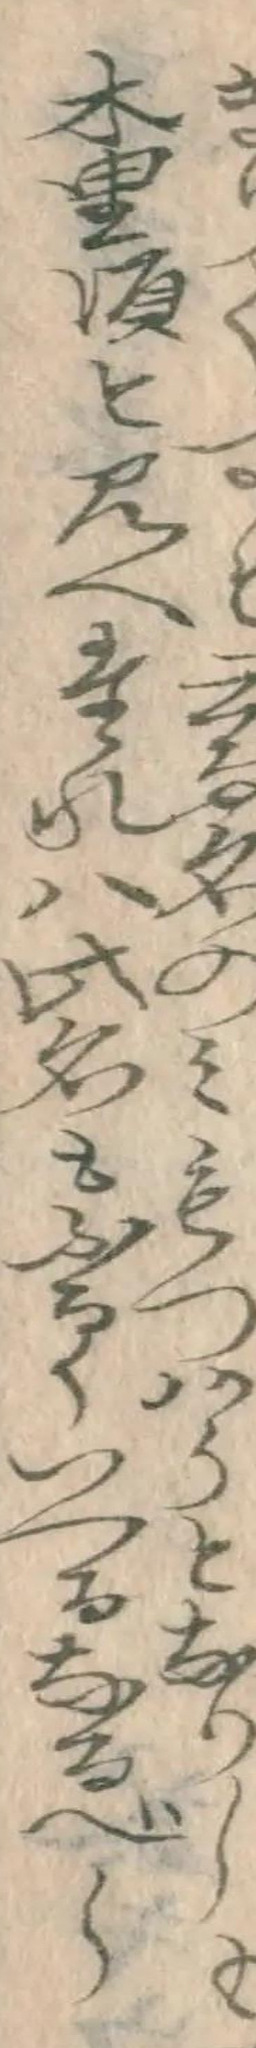木里須と見へたれハ此名もふるくいへるなるべし

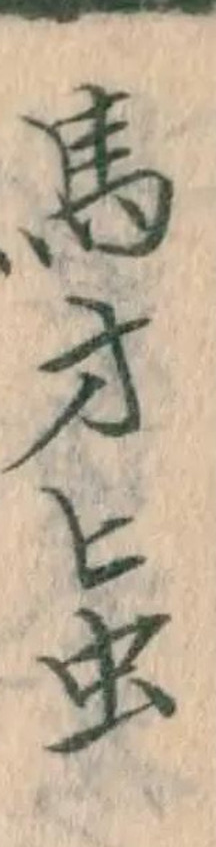馬オヒ虫
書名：千蟲譜 3巻. [3]
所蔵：国立国会図書館 National Diet Library, JAPAN
